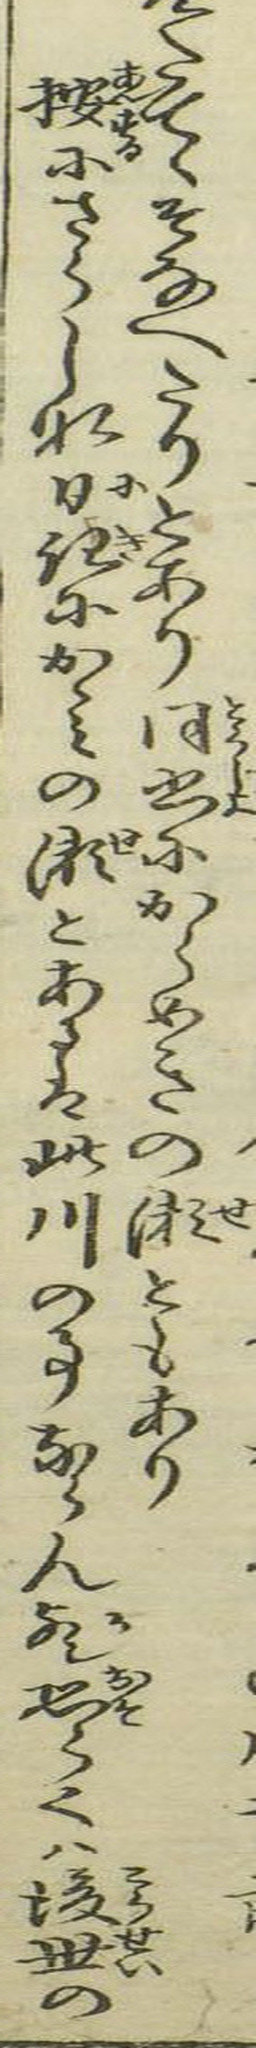按にさらしな日記にかゝみの瀬とあるは此川の事ならん歟恐らくは後世の

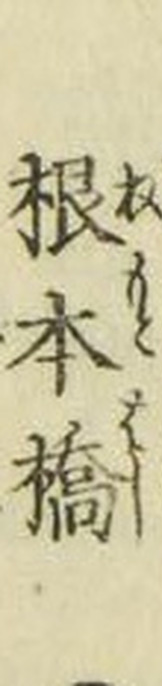根本橋
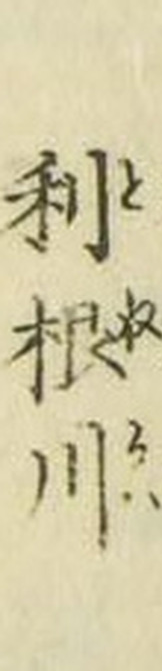利根川
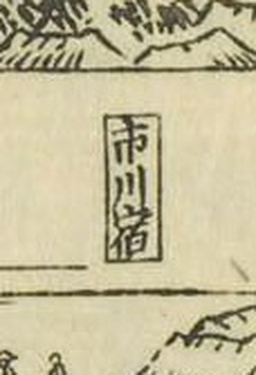市川宿
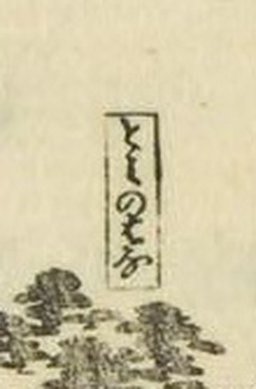とみのはな
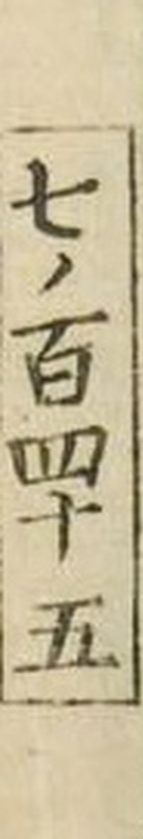七ノ百四十七
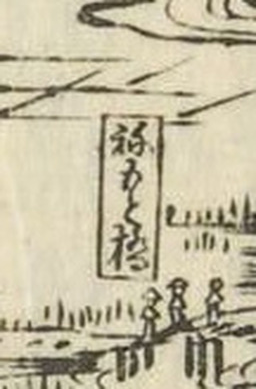ねもと橋
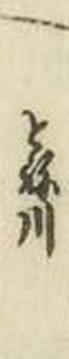とね川

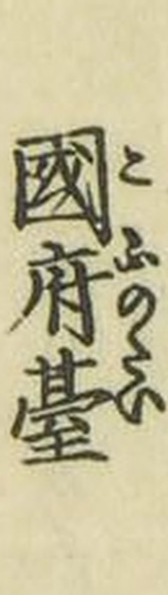国府台
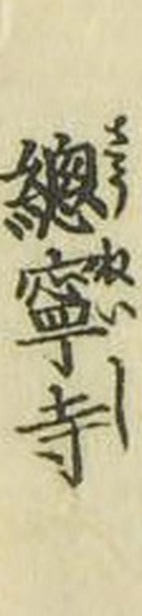総寧寺
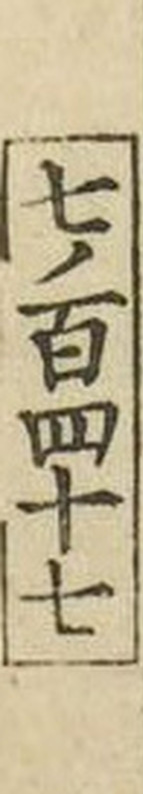七ノ百四十七

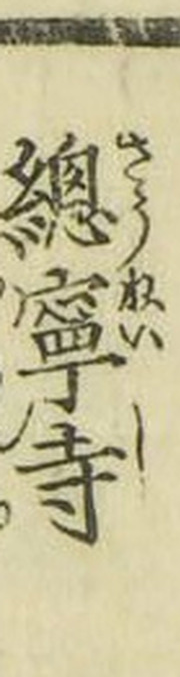総寧寺
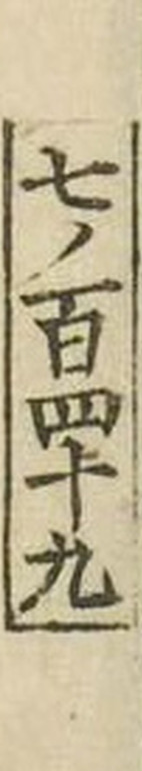七ノ百四十九

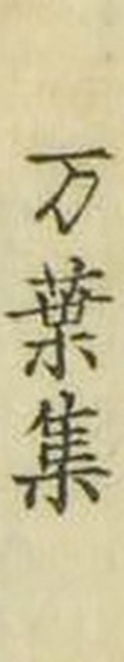万葉集
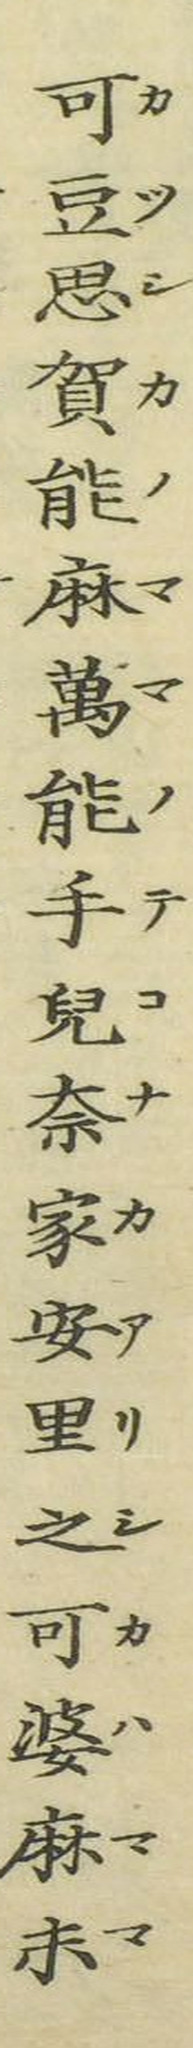可豆思賀能麻万能手児奈家安里之可婆麻末
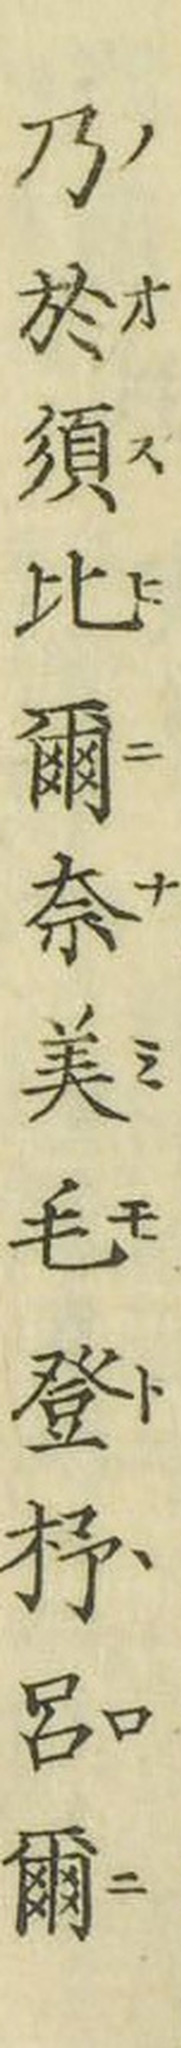乃於須比爾奈美毛登杼呂爾
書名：江戸名所図会 20巻 巻之20
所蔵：東京学芸大学教育コンテンツアーカイブ
